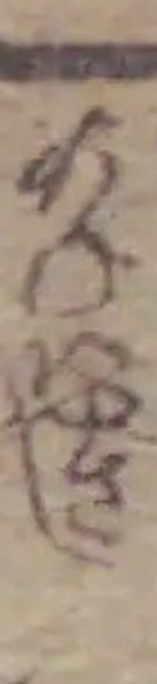あねはやさし
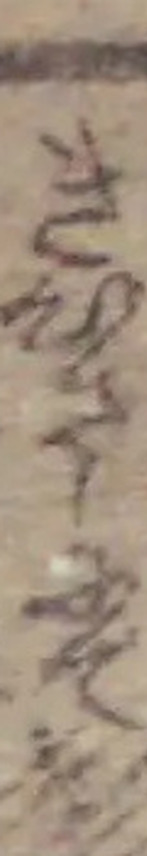き心さしにて
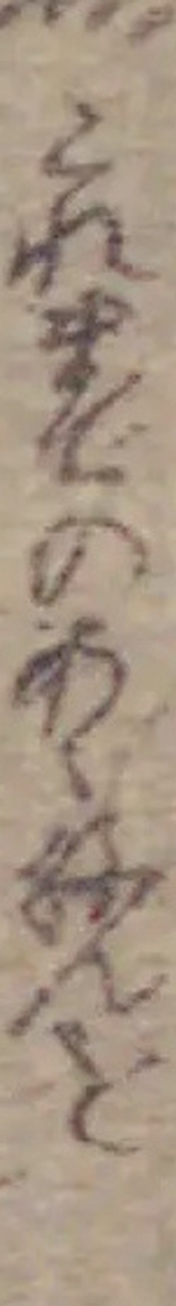これまでのあくねんを
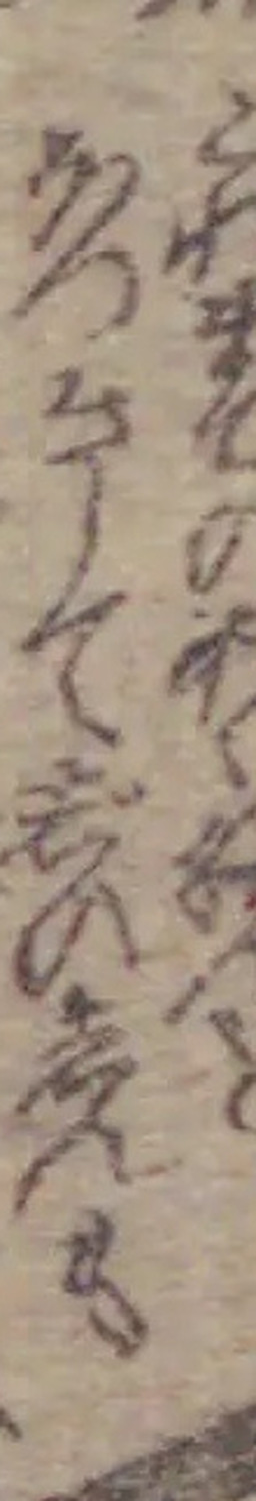ほつきしてじひしんも
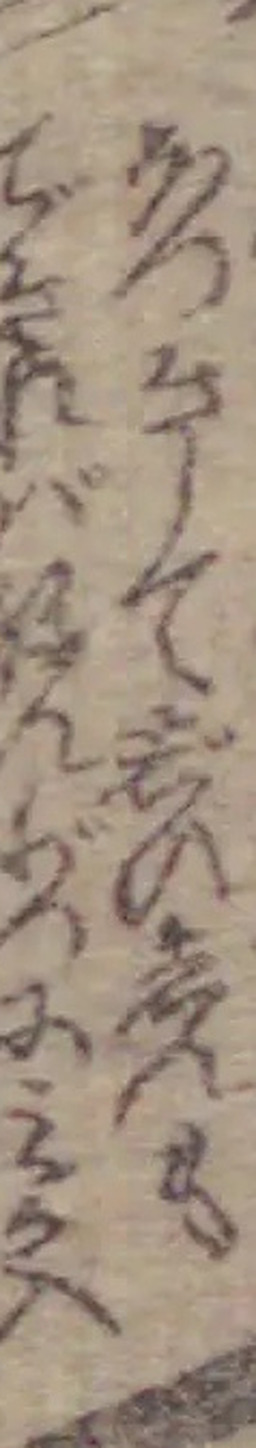てきればねんぶつにこゝろへ
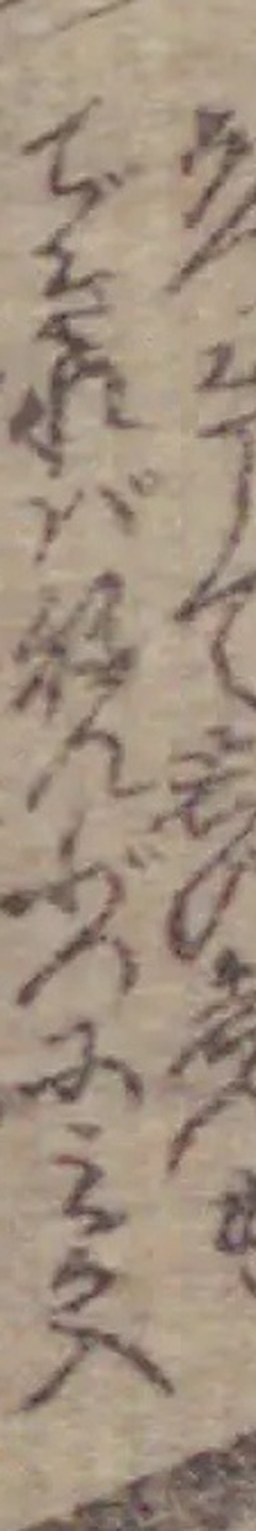てきればねんぶつにこゝろへ
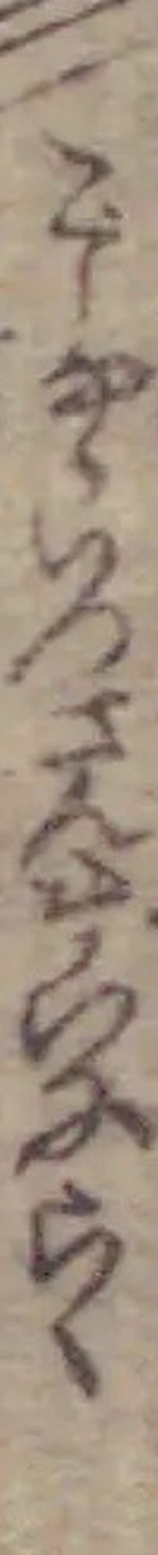ごしやういつさんまいにらく
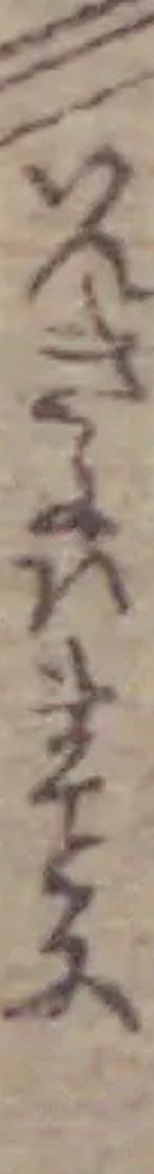いんきよはまことに
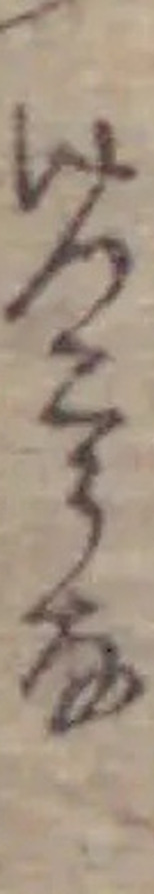けつこうな
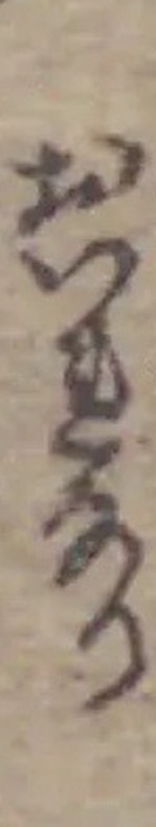おいれなり
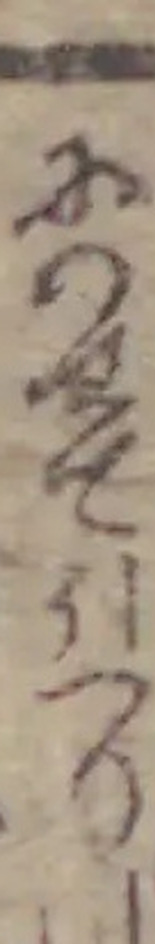にのせて引つり
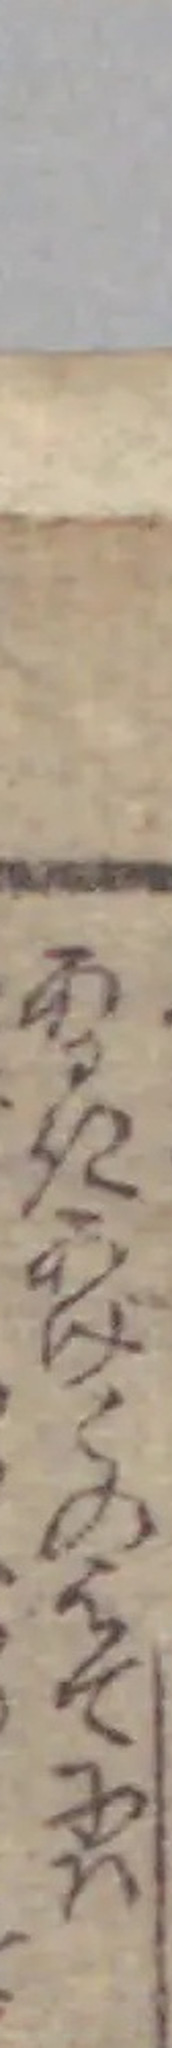あるきあげくのはてには
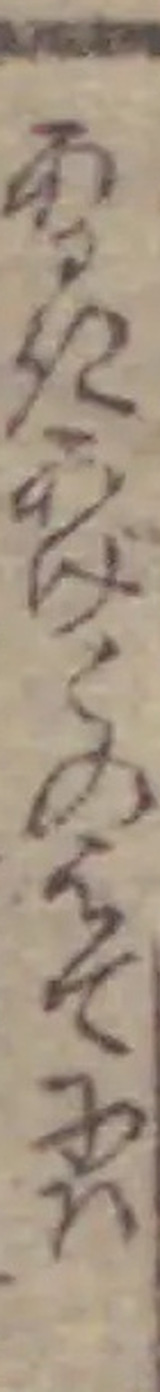あるきあげくのはてには
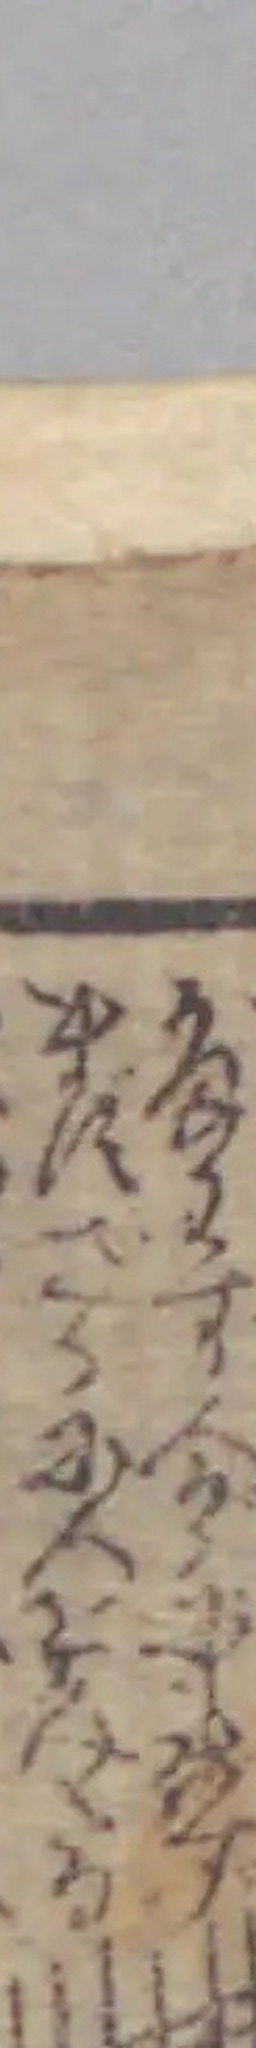まずざらに人をかけたる
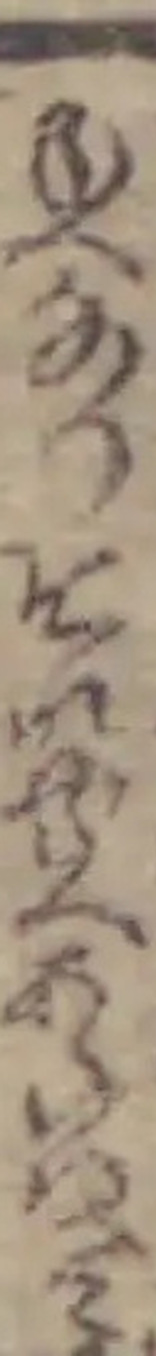ゆへなりそれゆへあけはさて
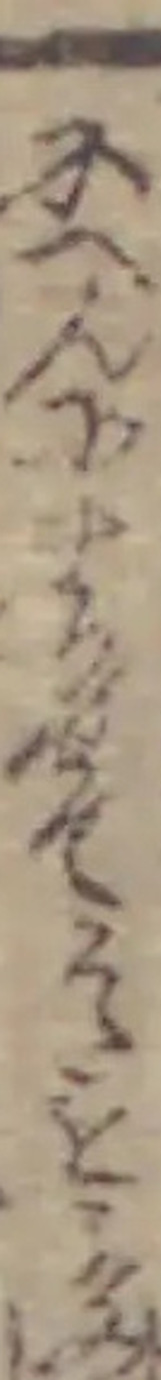にへんにまかせてうたをよみ
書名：奥州咄 3巻
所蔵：国立国会図書館 National Diet Library, JAPAN
